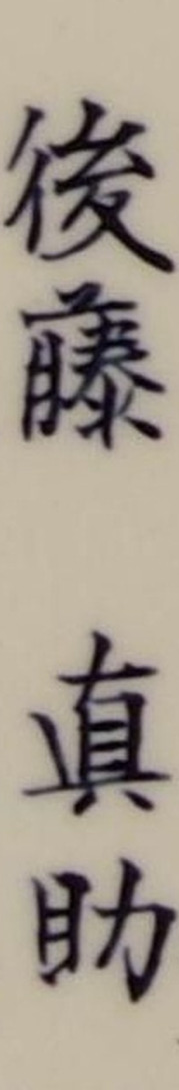後藤真助
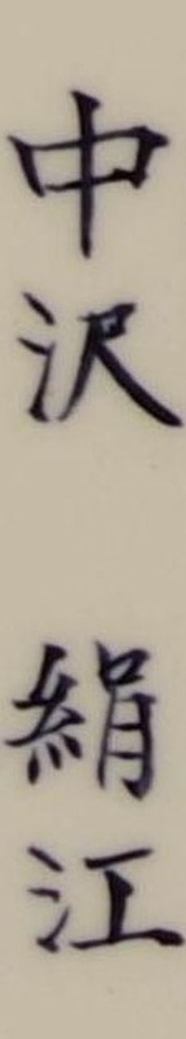中沢絹江
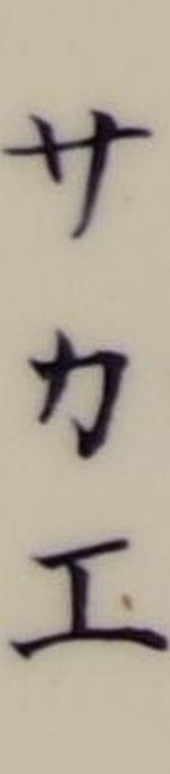サカエ
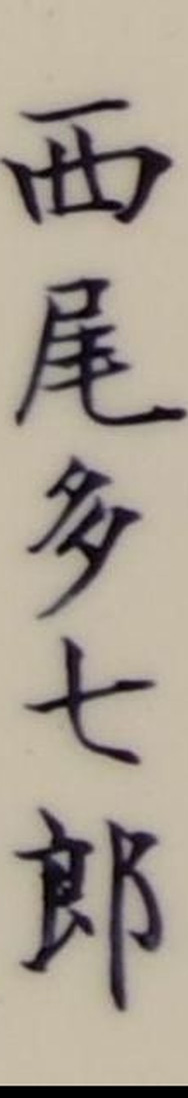西尾多七郎

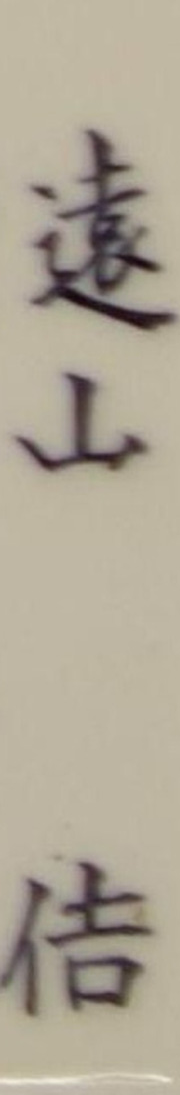遠山佶
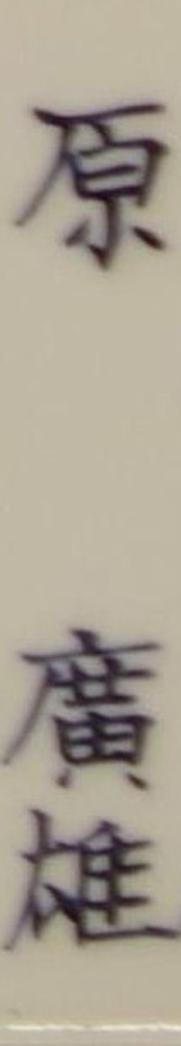原広雄
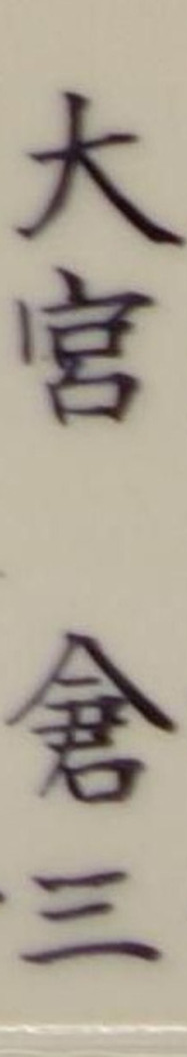大宮倉三
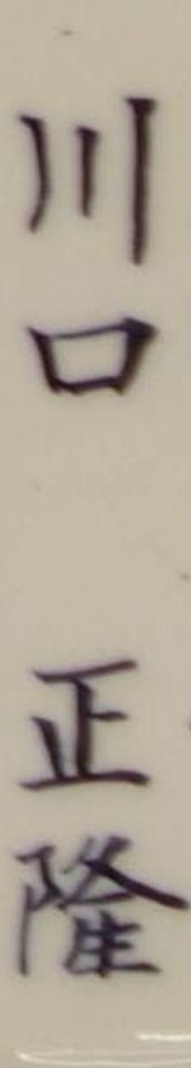川口正隆
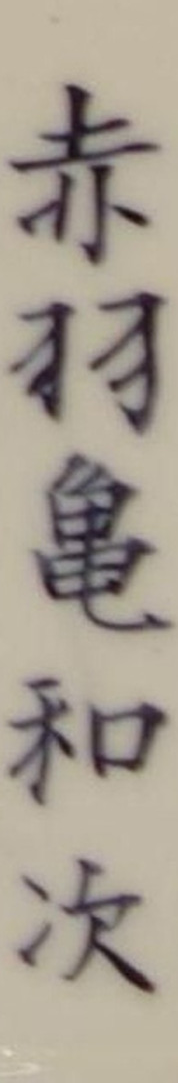赤羽亀和次
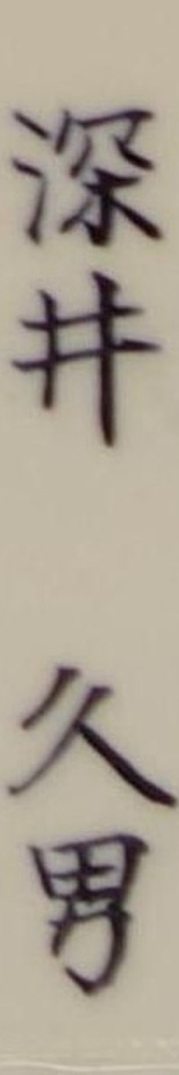深井久男
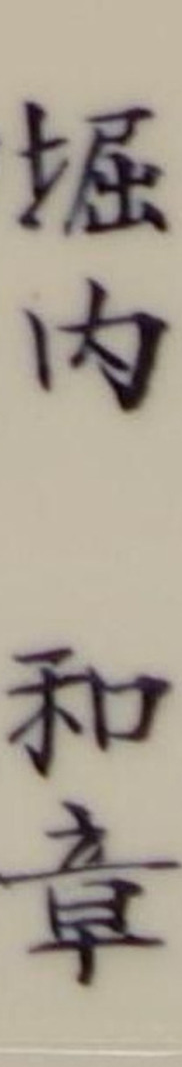堀内和章
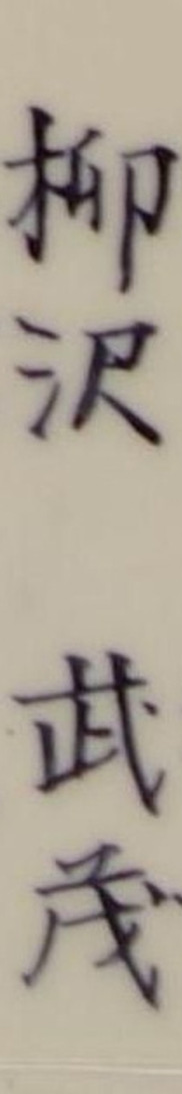柳沢武茂
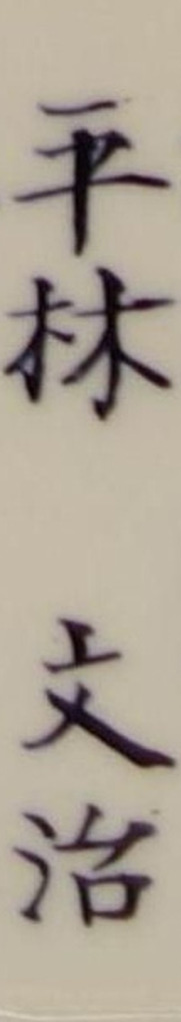平林文治
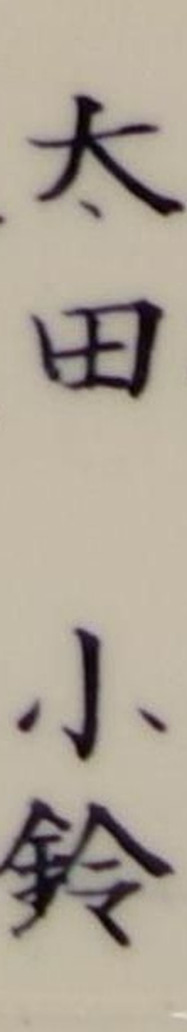太田小鈴
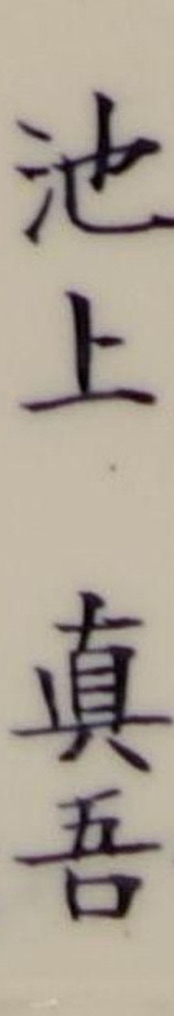池上真吾
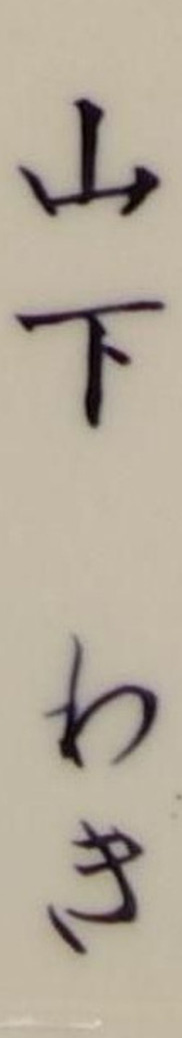山下わき
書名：M~S
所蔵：高野山金剛峯寺
